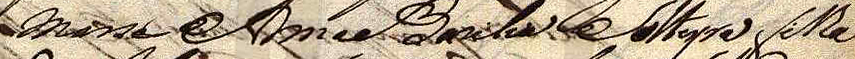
marse Anna Bazilia solteyra filha
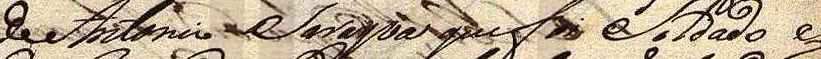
de Antonio sarayva que foi soldado e
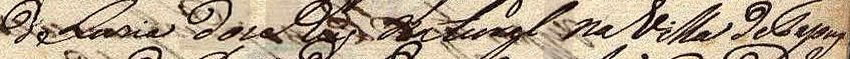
de Luzia dos Reis natural na Villa de Tapus
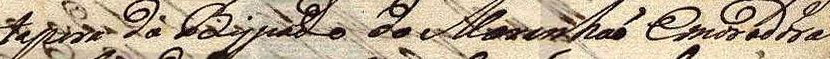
tapira do Bispado do Maranhaõ e moradora
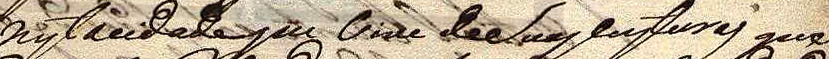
nesta cidade que vive de suas custuras que
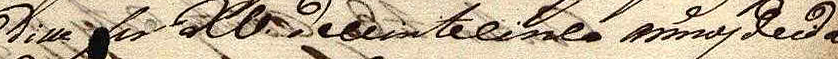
disse ser xv. de vinte cinco annos de ida
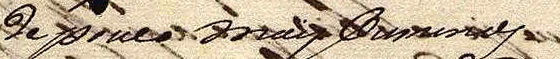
de pouco mais ou menos
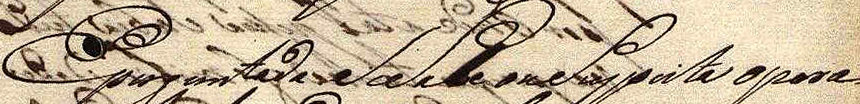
E perguntada se sabe ou suspeita o para
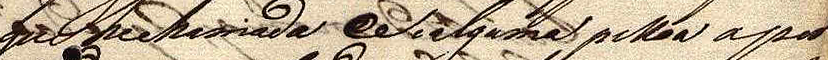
que he chamada e se alguma pessoa a per
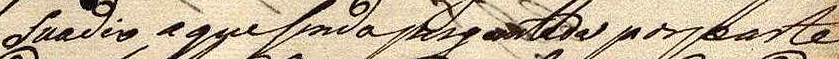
suadio a que sendo perguntada por parte
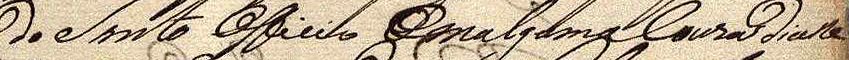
do Santo Officio em alguma Couza dicesse
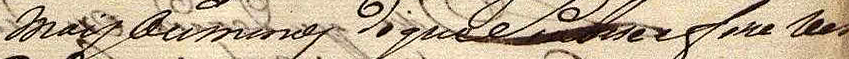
mais ou menos do que S_besse fosse ver
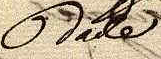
dade
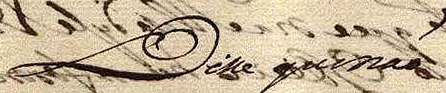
Disse que naõ
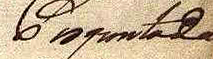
Perguntada
